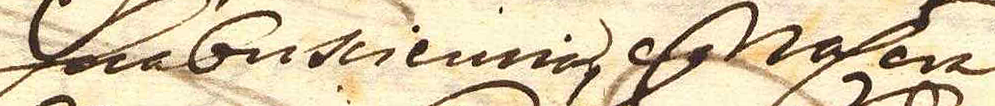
sua consciencia, e q̄ naꝭ era
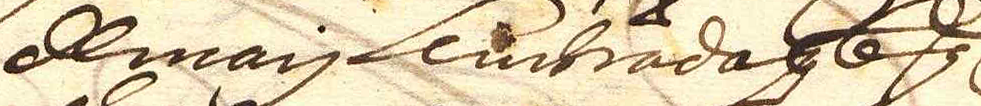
de mais lembrada plo q̄
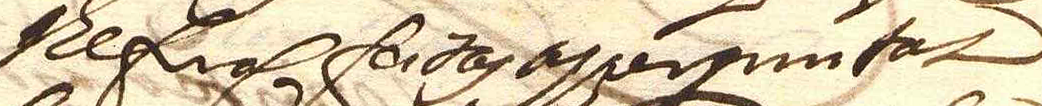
lhe foraꝭ feitas as perguntas
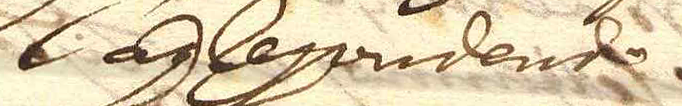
a q̄ Respondendo
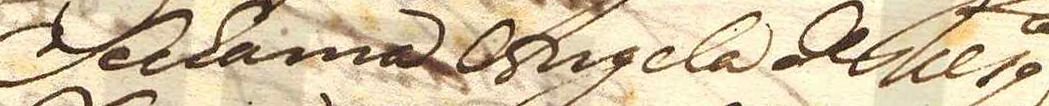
se chama Angela de Mesqta
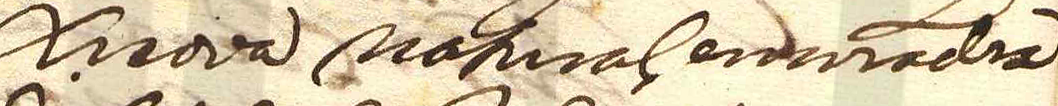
X. nova natural, e moradora
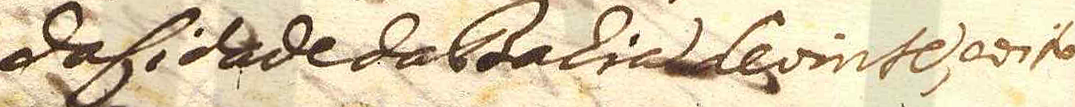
da Cidade da Bahia de vinte, e oito
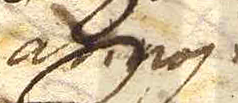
annos.
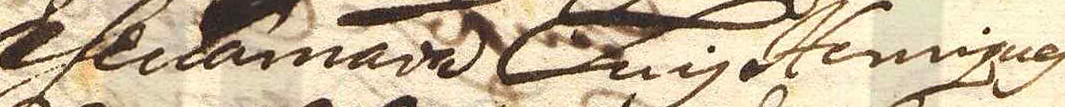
e se chamava Luis Henriques
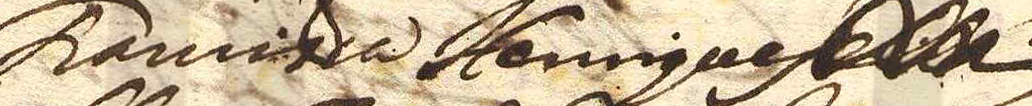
Francisca Henriques X n.
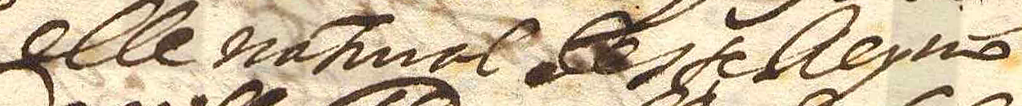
elle natural deste Reyno
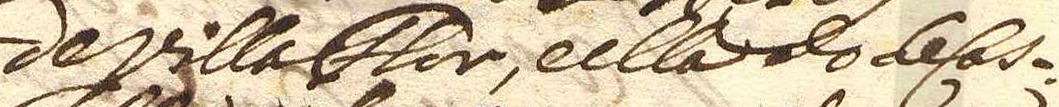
de villa Flor, e ella do de Cas
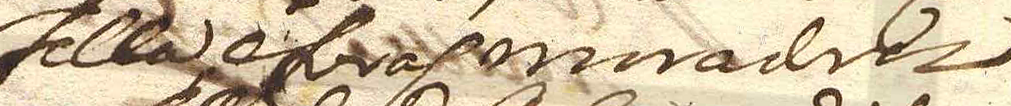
tella, e foraꝭ moradorez
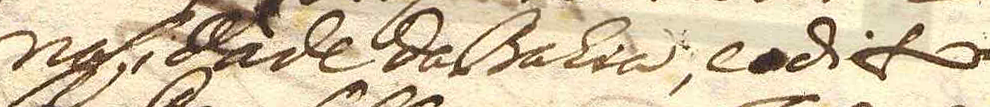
na Cidade da Bahia, e o dito
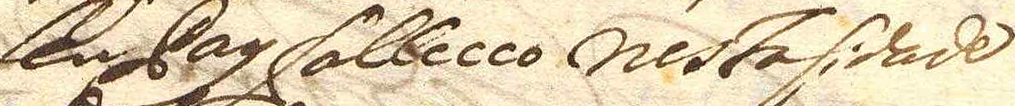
seu Pay falleceo nesta Cidade
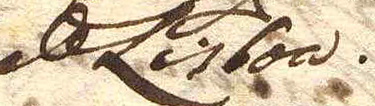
de Lisboa.
